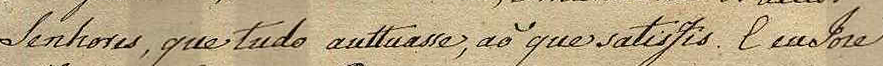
Senhores, que tudo auttuasse, aõ que satisfis. E eu Ioze
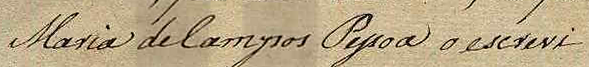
Maria de Campos Pessoa o escrevi
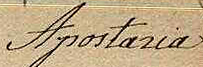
Apostazia
